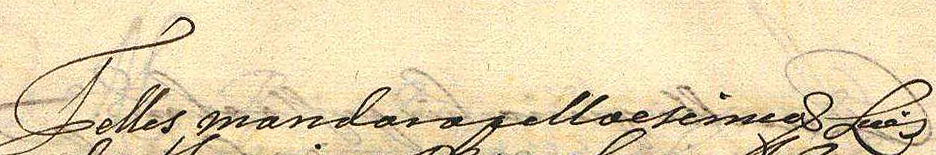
Telles mandara pello escriuaõ Luis
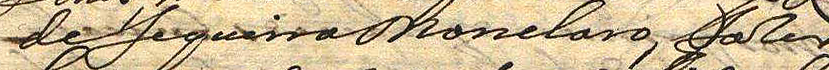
de sequeira Monclaro, fazer
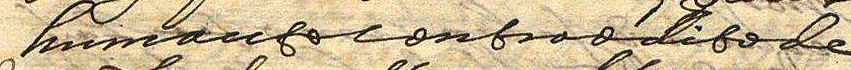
hum auto contra o dito de
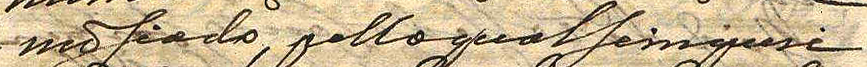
nūsiado, pello qual se inquiri
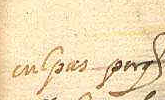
culpas por q̄
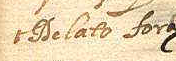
o Delato fora
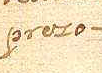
prezo
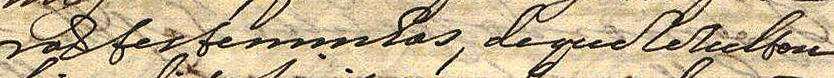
raõ testemunhas, de que Rezultou
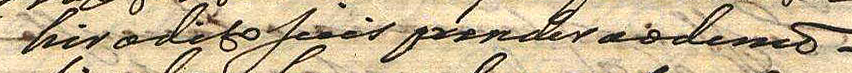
hir o dito Juis prender ao denū
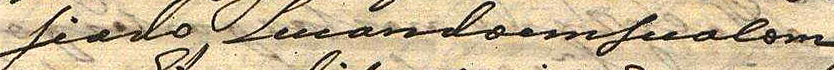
siado, Leuando em sua com
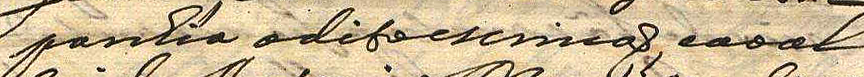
panhia o dito escriuaõ e ao al
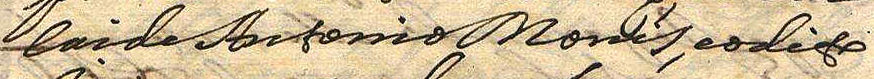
caide Antonio Monis, e o dito
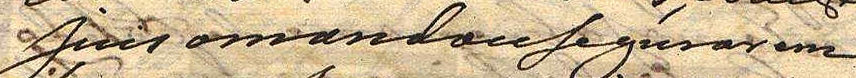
Juis o mandou segurar em
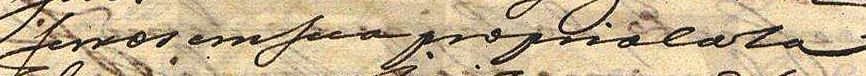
ferros em sua propria caza
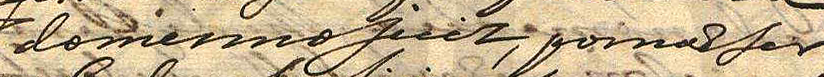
do mesmo Juiz por naõ ser
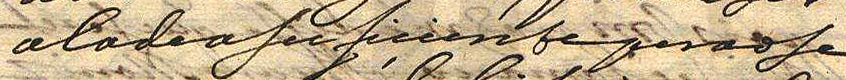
a Cadea suficiente pera o se
